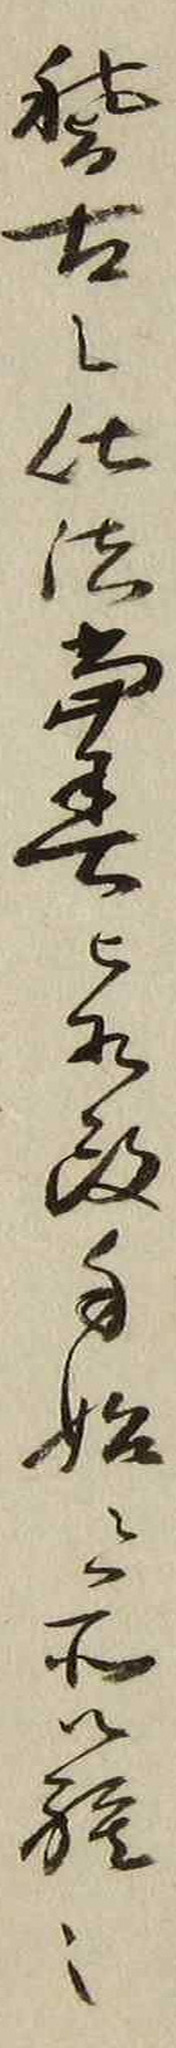稽古之仕法当春被相改手始ニ御所御旗之
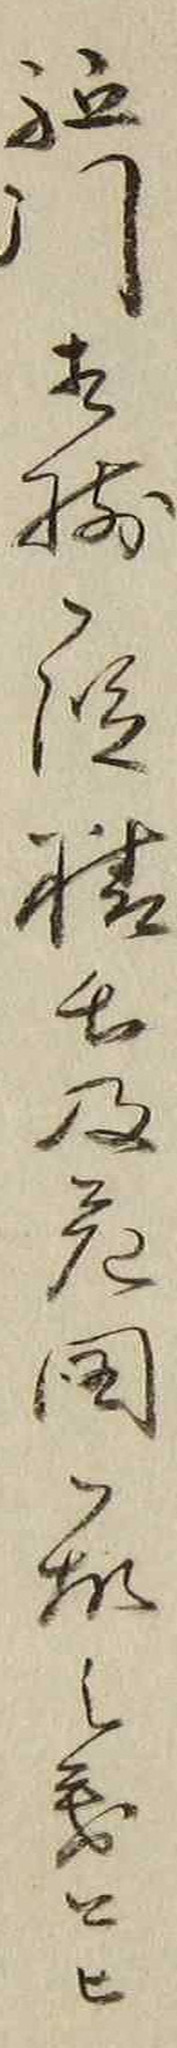駆引相揃候段精出及指図候故之義と被
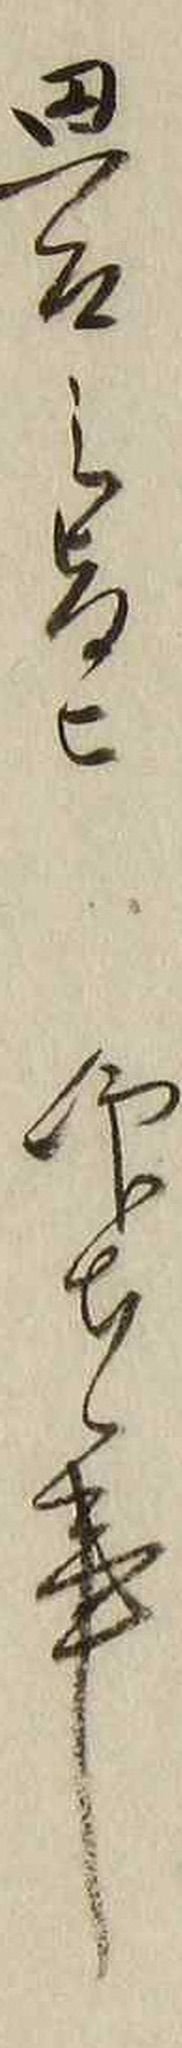思召之旨被仰出候事
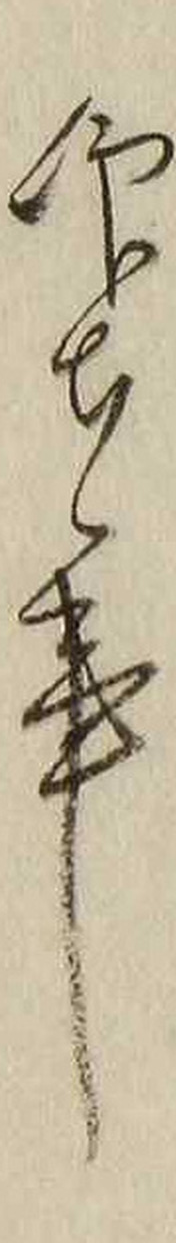仰出候事
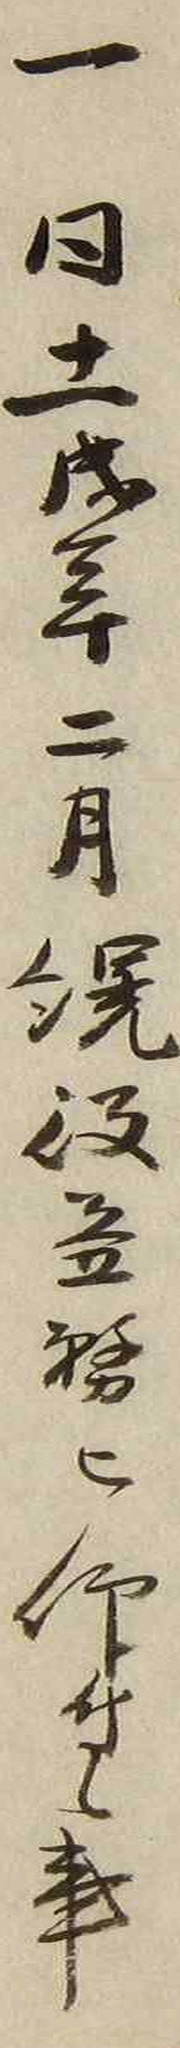一同十一戌年二月縨役兼務被仰付候事
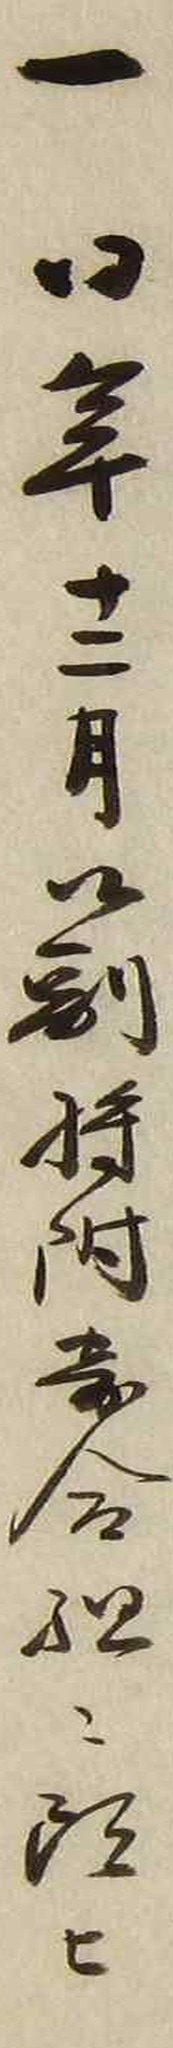一同年十二月御副将附寄合組々頭被

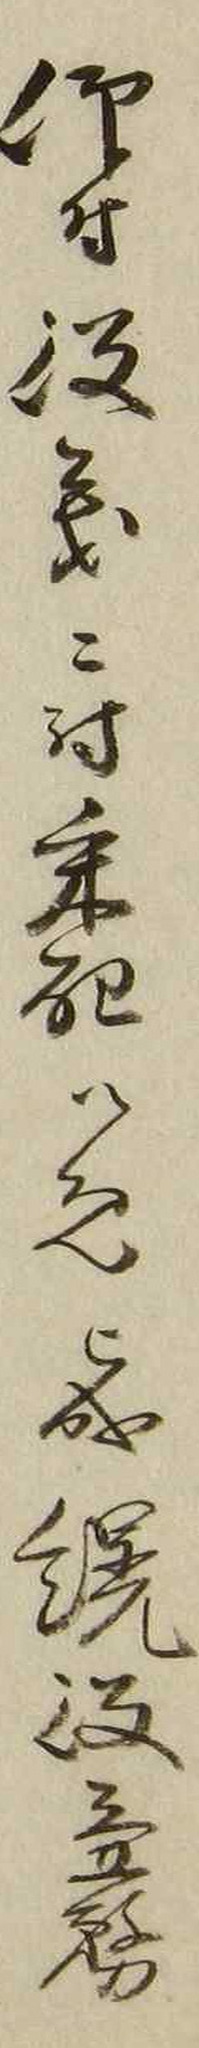仰付役義ニ付采配御免被成縨役兼務
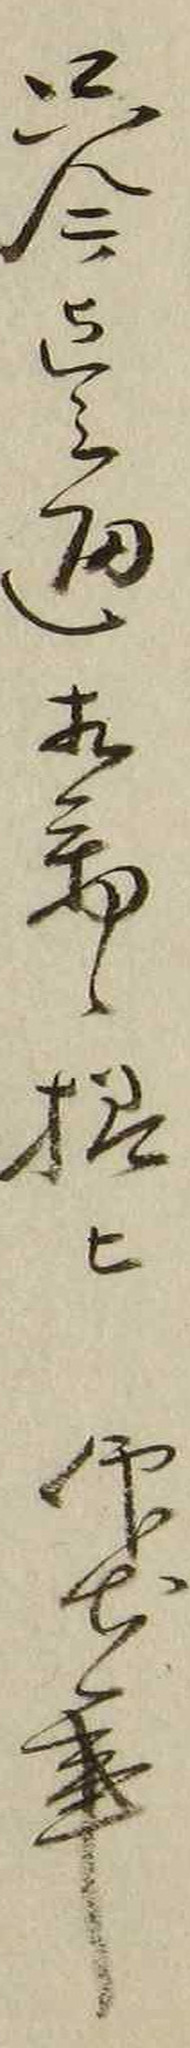只今迄之通相勤候様被仰出候事
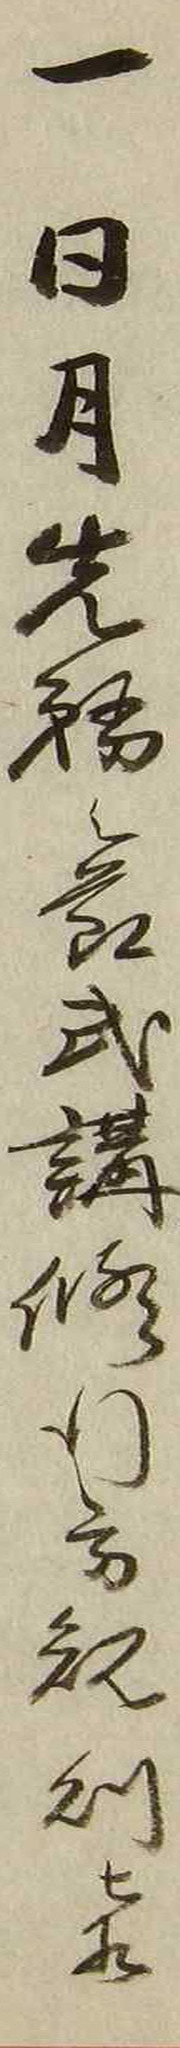一同月先務之節武講修行方規則被相
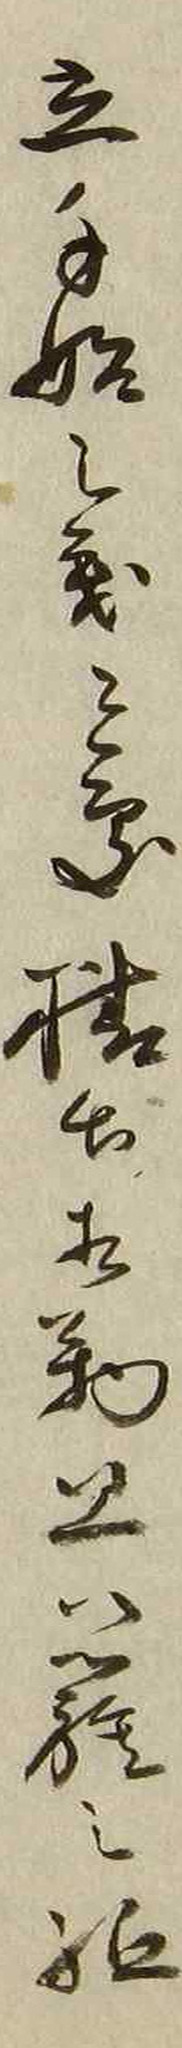立手始之義ニ候処精出相勤且御簱之駈
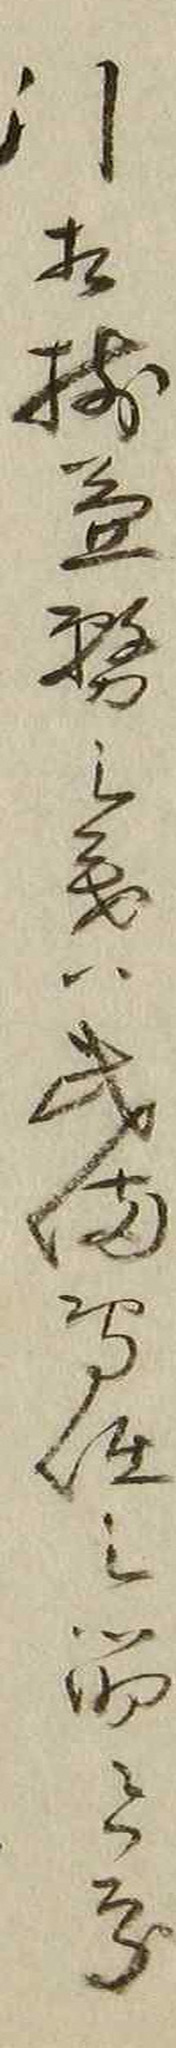引相揃兼務之義ハ武備守任之筋ニ候処
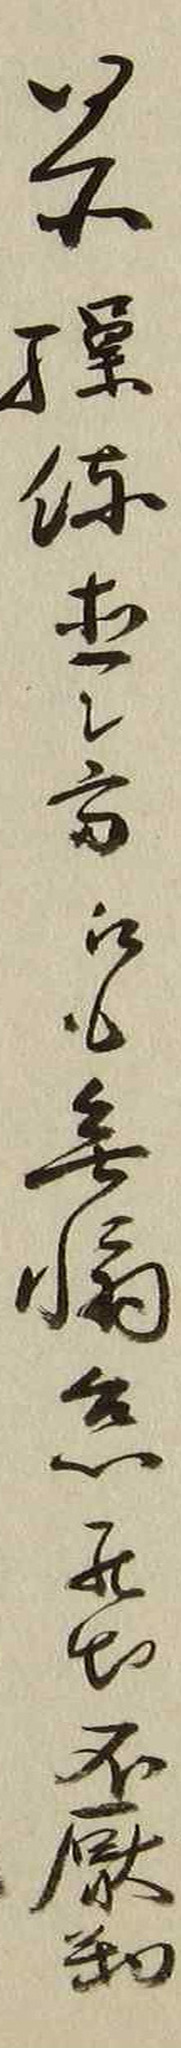同所操練直シ方江も無懈怠罷出切不厭勤
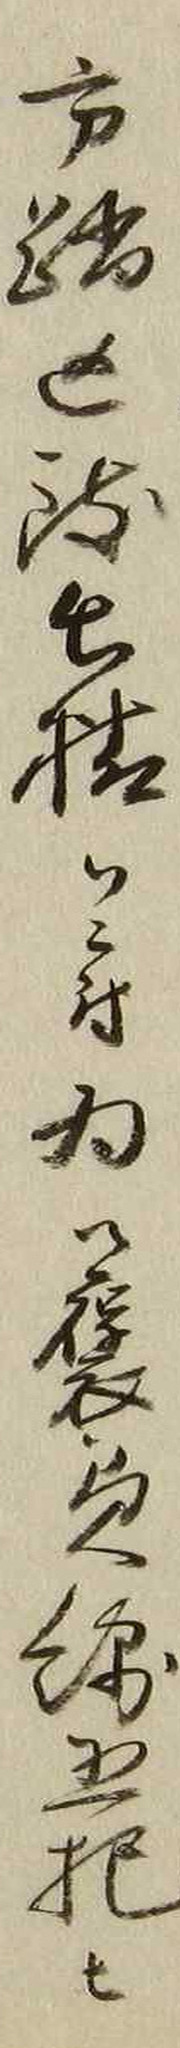方踏込致出精候ニ付為御褒美綿五把被
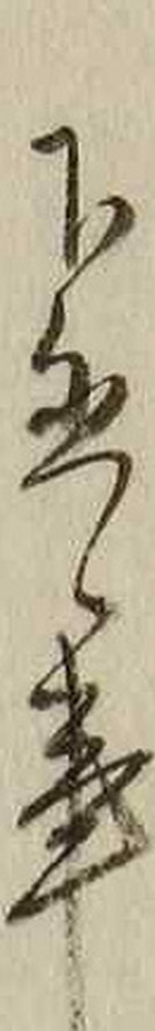下置候事
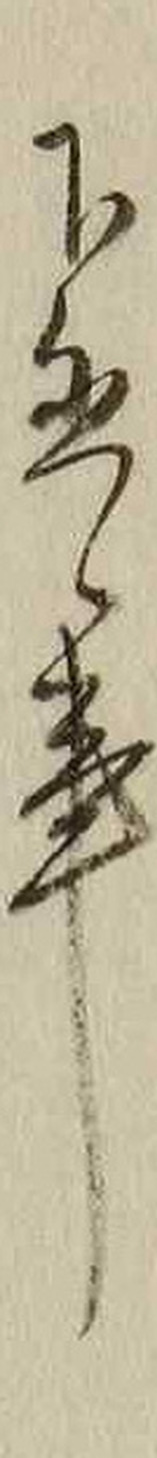下置候事
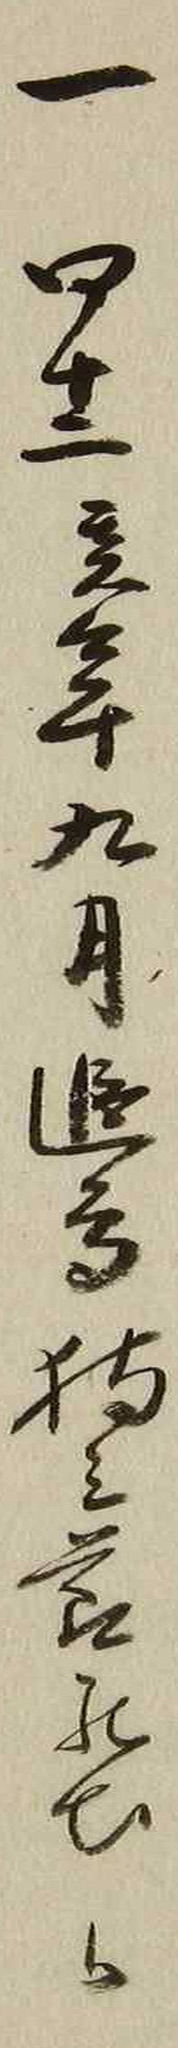一同十二亥年九月追鳥狩之節罷出候
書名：諸士系譜　巻之311　し之部1
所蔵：会津若松市立会津図書館
